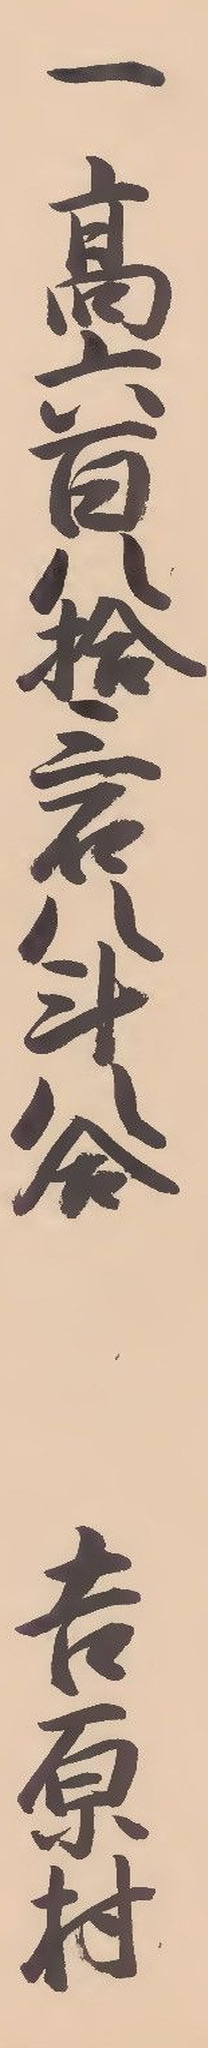一高六百八拾三石八斗八合吉原村
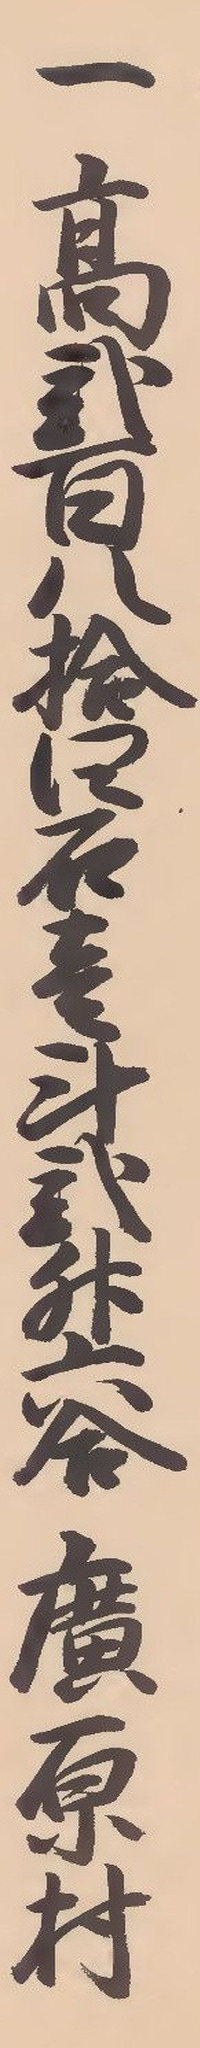一高弐百八拾四石壱斗弐升六合広原村
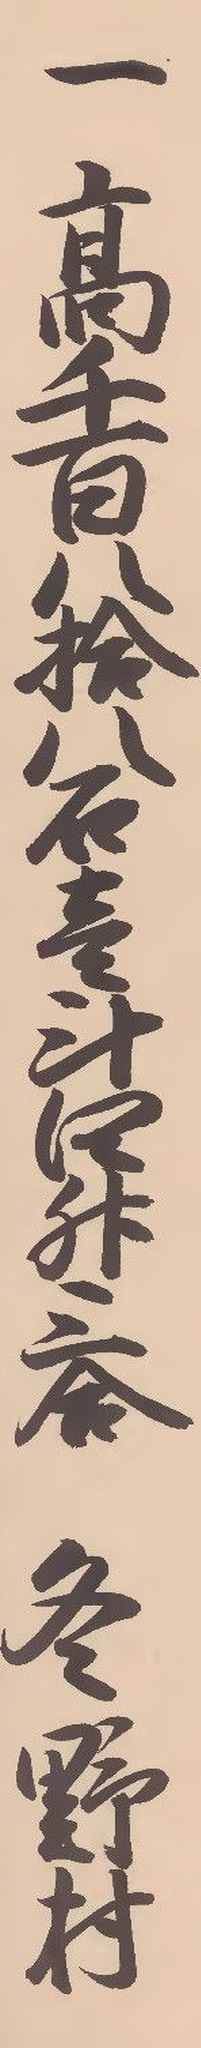一高千八百八拾八石壱斗四升三合冬野村
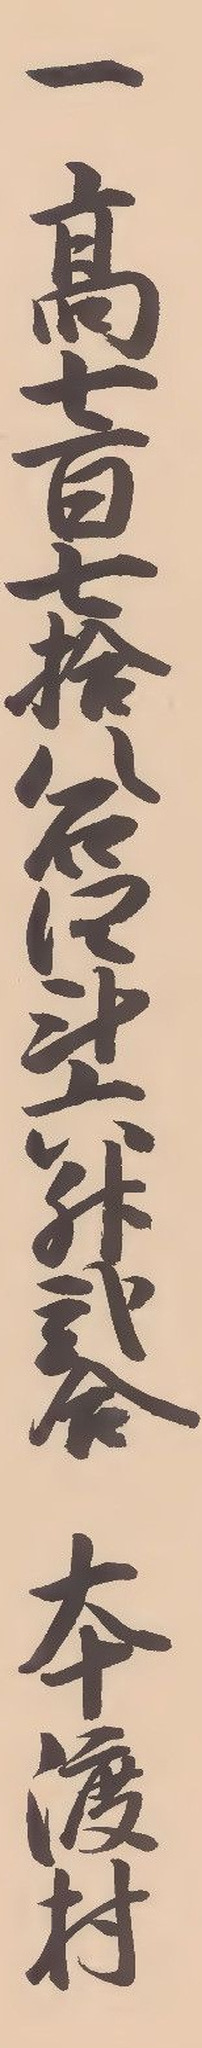一高七百七拾八石四斗六升弐合本渡村
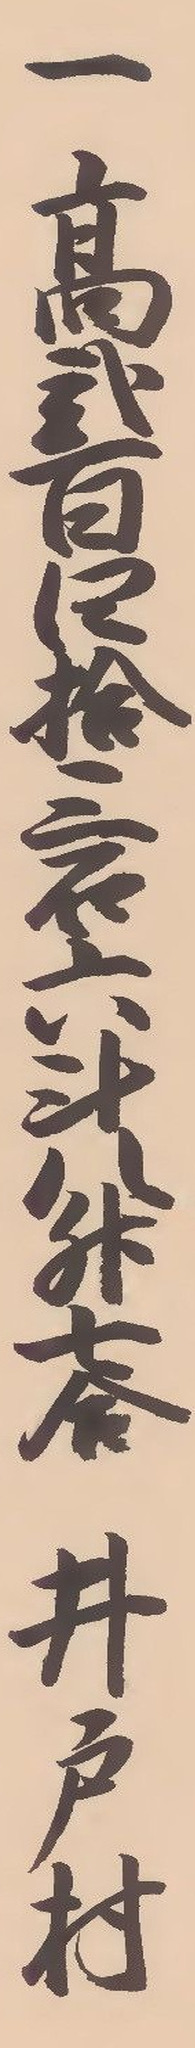一高弐百四拾三石六斗八升七合井戸村
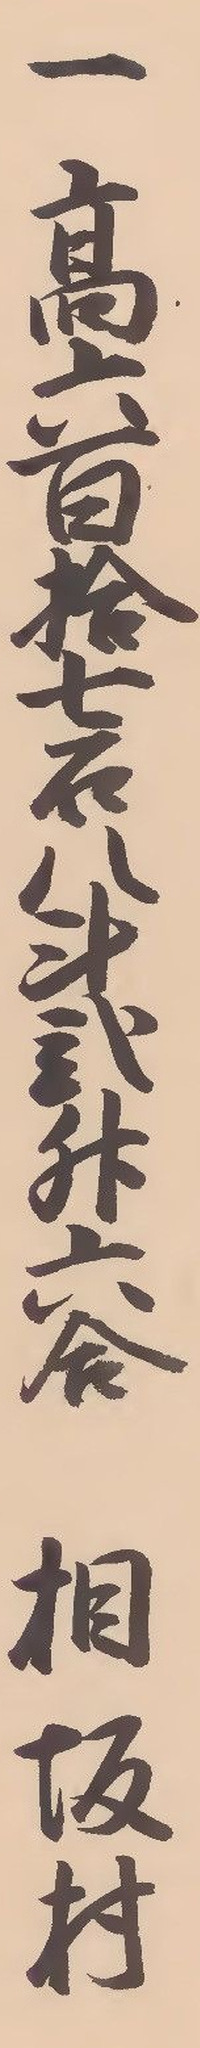一高六百拾七石八斗弐升六合相坂村

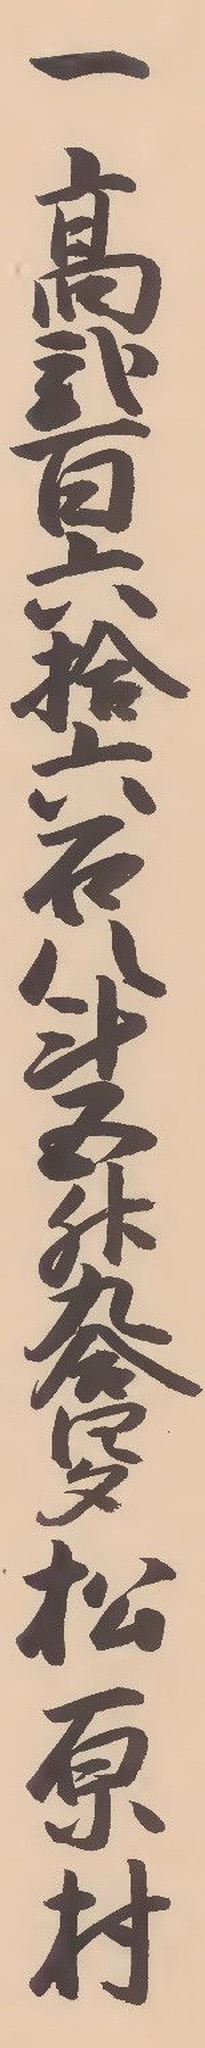一高弐百六拾六石八斗五升九合四勺松原村
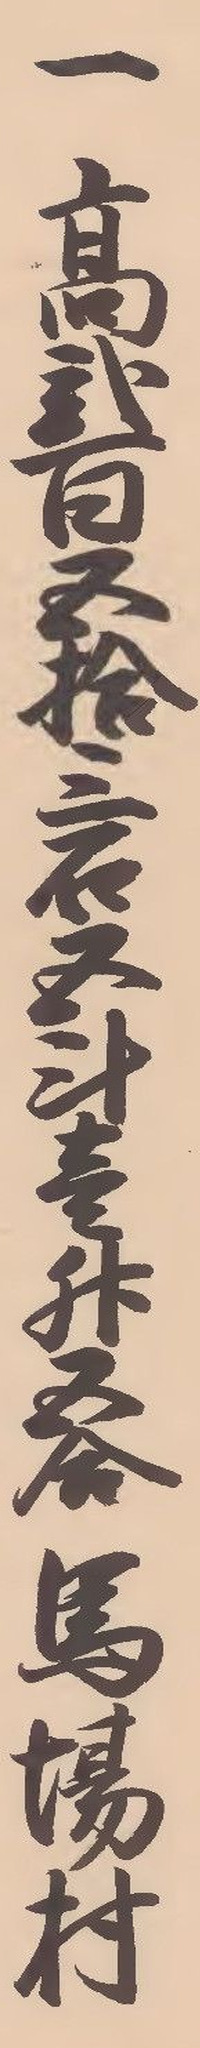一高弐百五拾三石五斗壱升五合馬場村
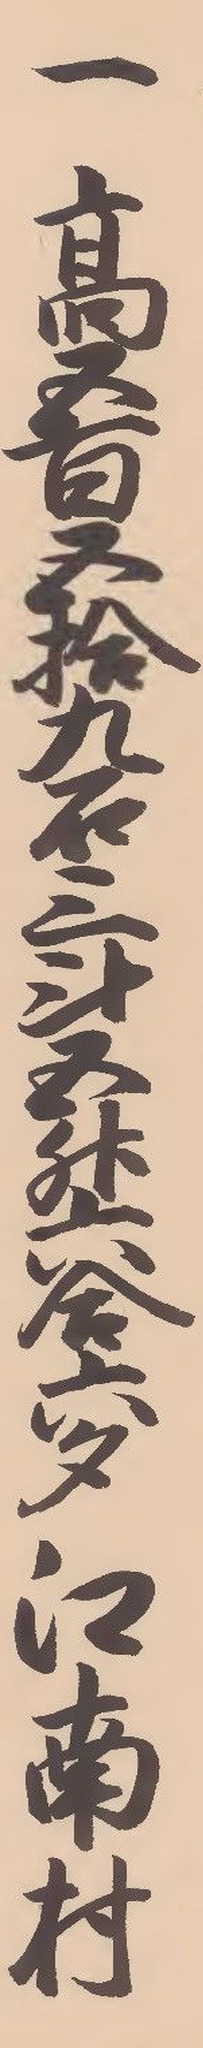一高五百五拾九石三斗五升六合六勺江南村
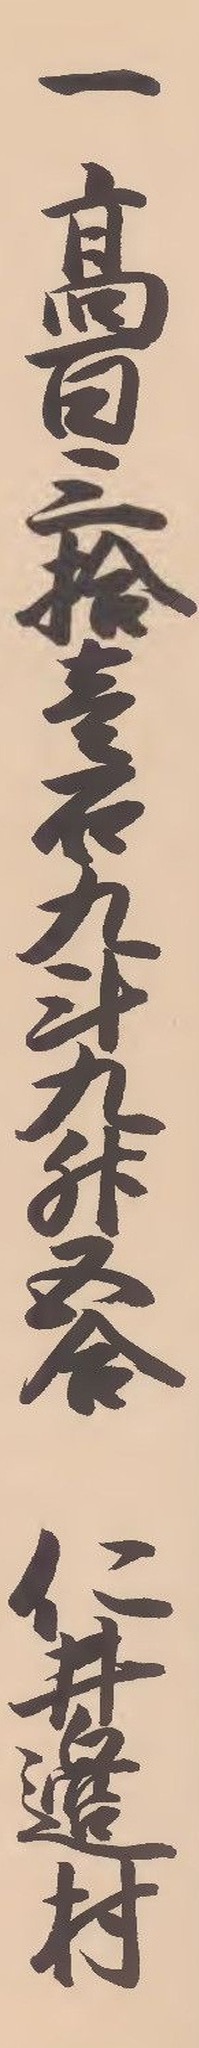一高百三拾壱石九斗九升五合仁井辺村
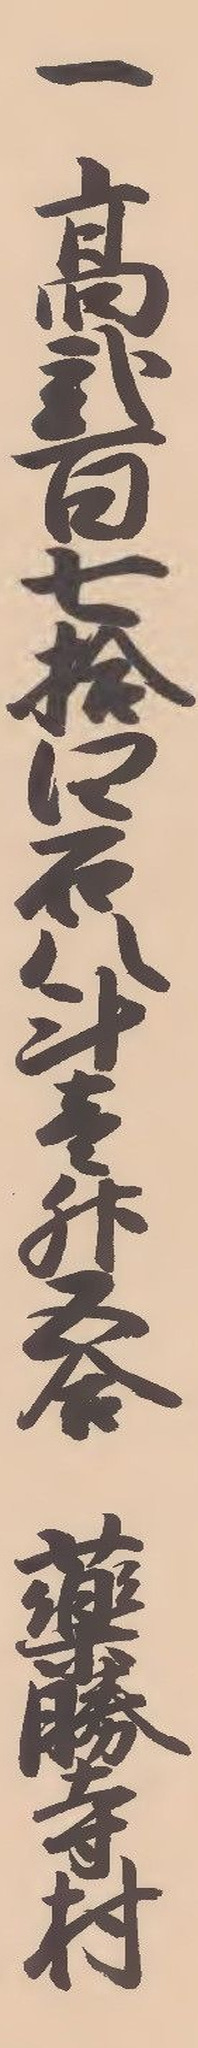一高弐百七拾四石八斗壱升五合薬勝寺村
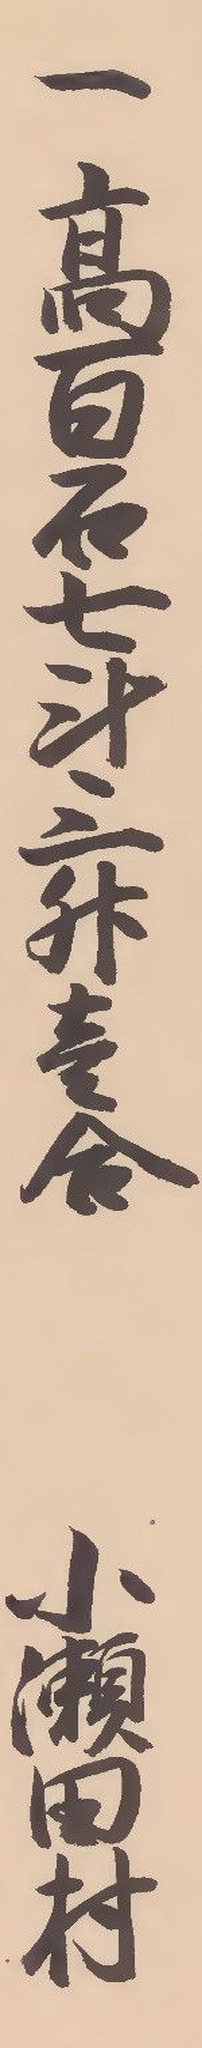一高百石七斗三升壱合小瀬田村
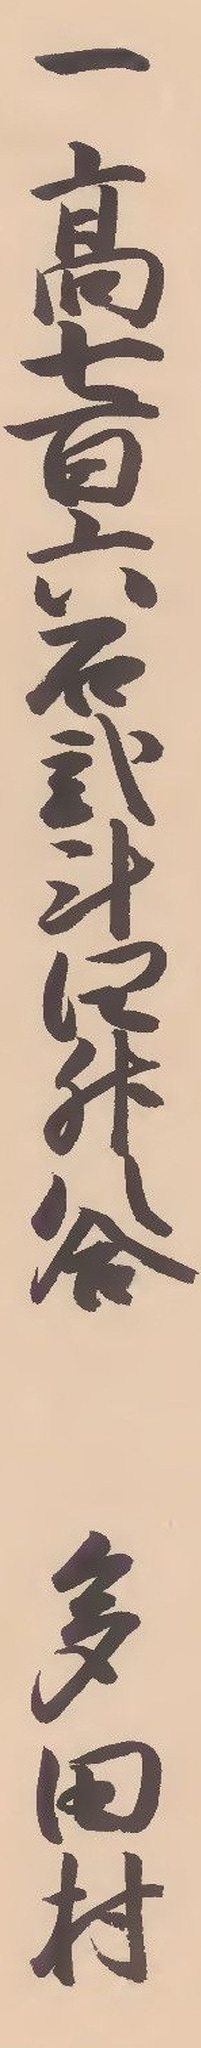一高七百六石弐斗四升八合多田村

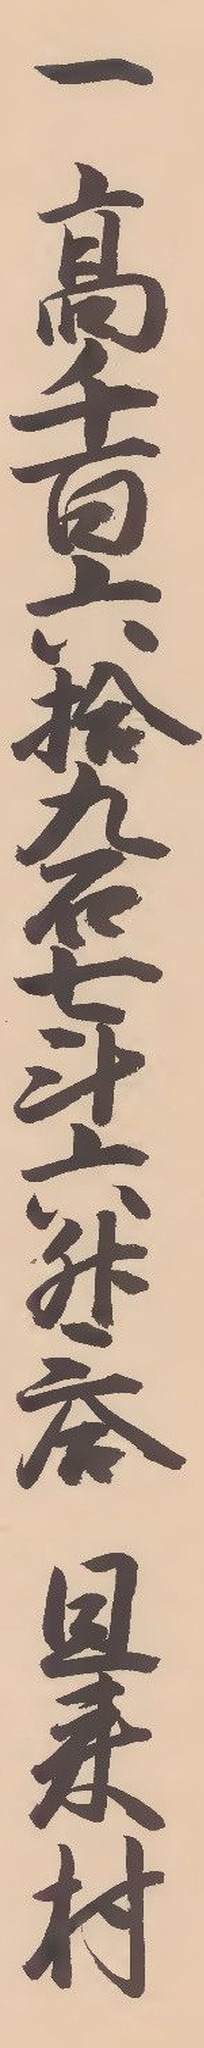一高千百六拾九石七斗六升三合旦来村
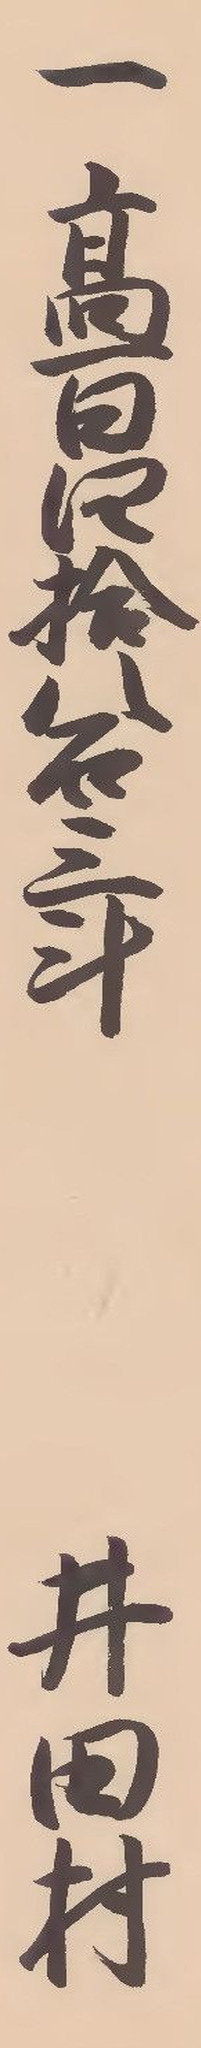一高百四拾八石三斗井田村
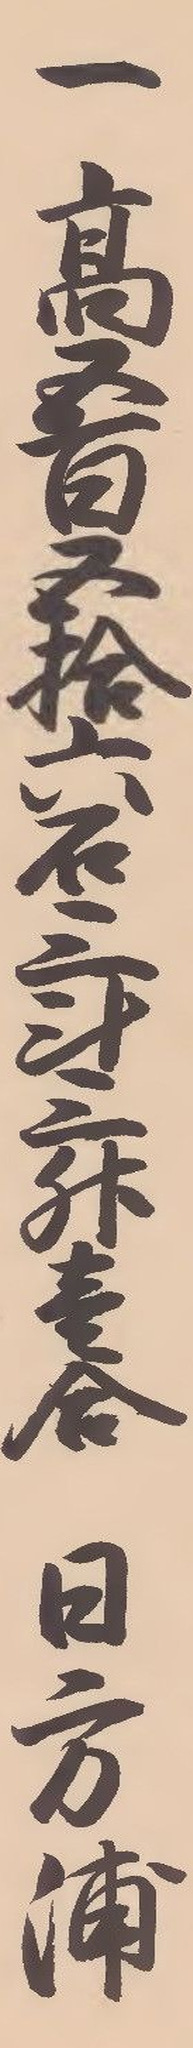一高五百五拾六石三斗三升壱合日方浦
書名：紀伊国郷帳
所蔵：国立公文書館 National Archives of Japan
